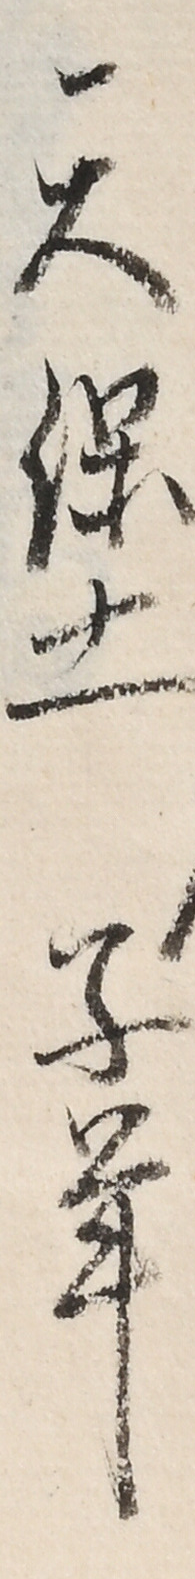天保十一庚子年
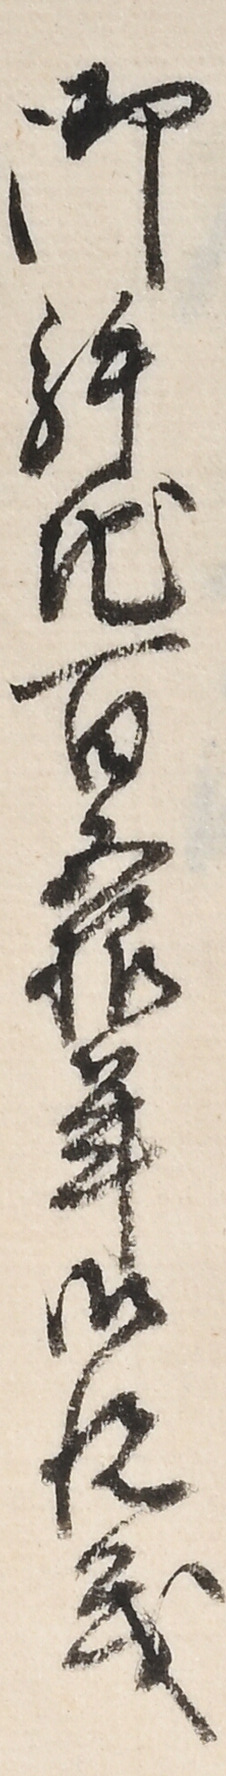御拝地百五拾年御祝儀
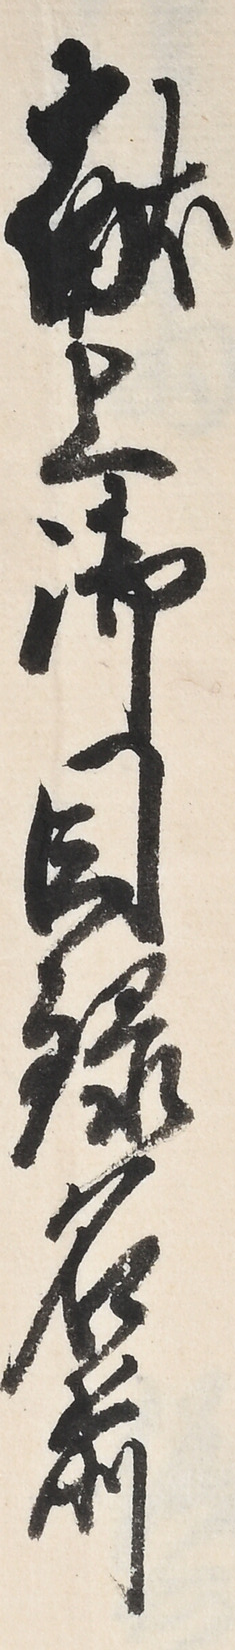献上御目録名前
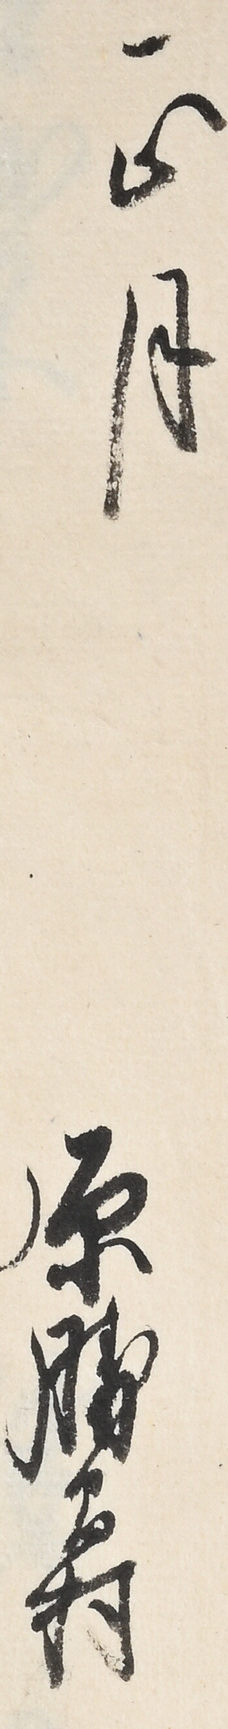正月原勝間村

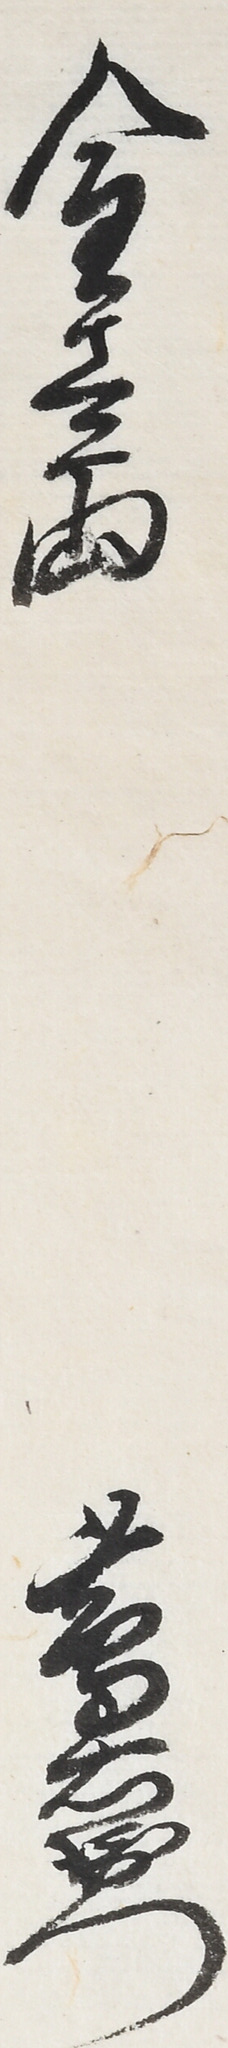金壱両蔦右衛門
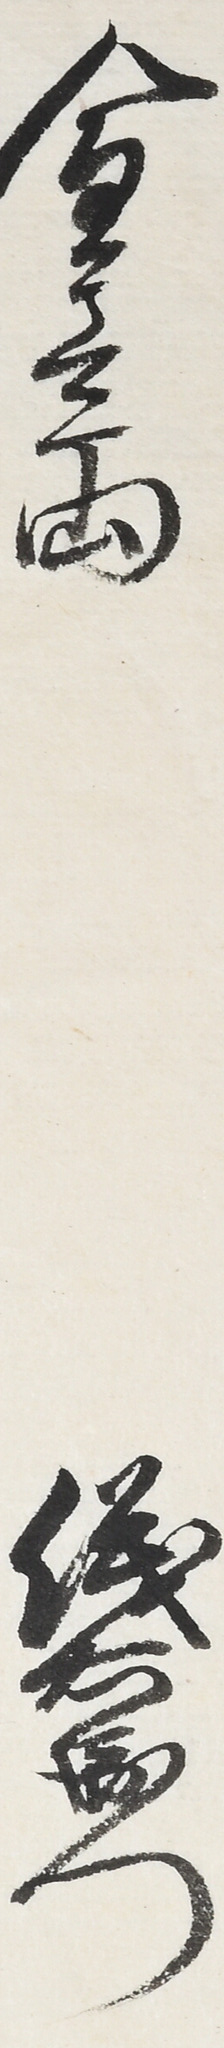金壱両儀右衛門
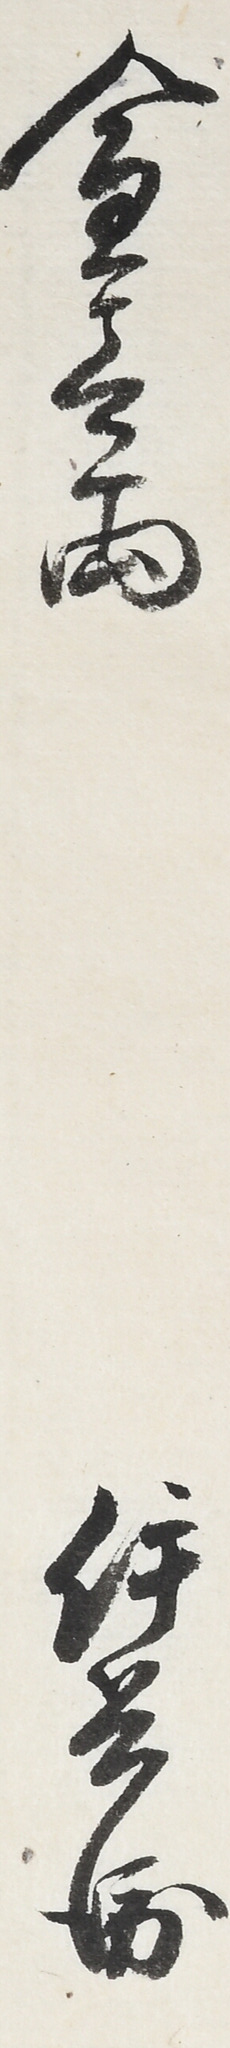金壱両伊兵衛
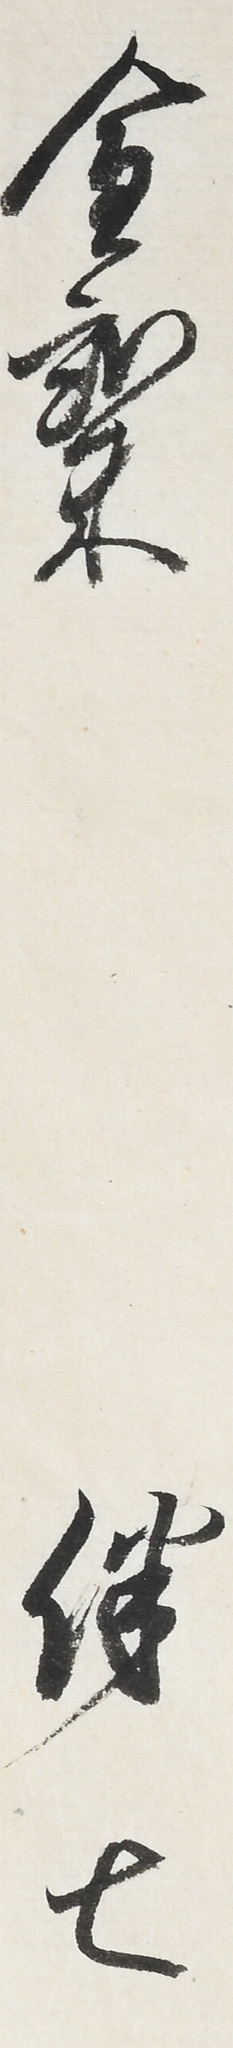金弐朱伴七

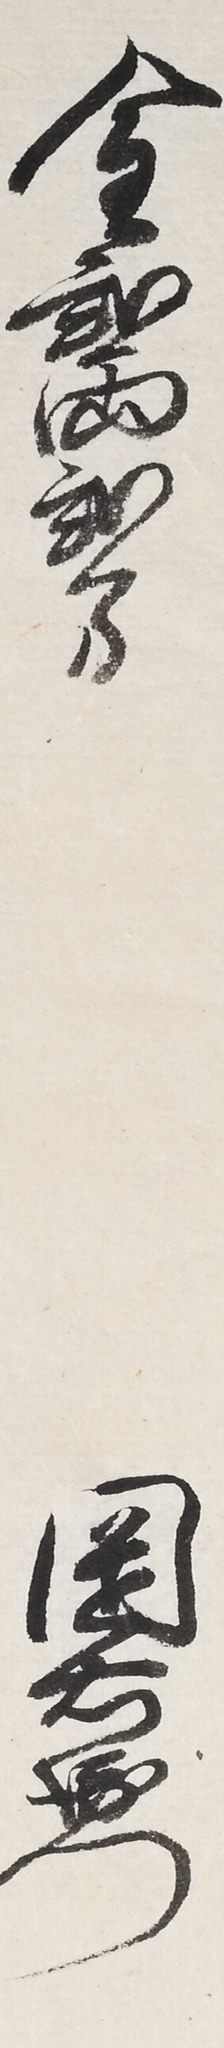金弐両弐分園右衛門
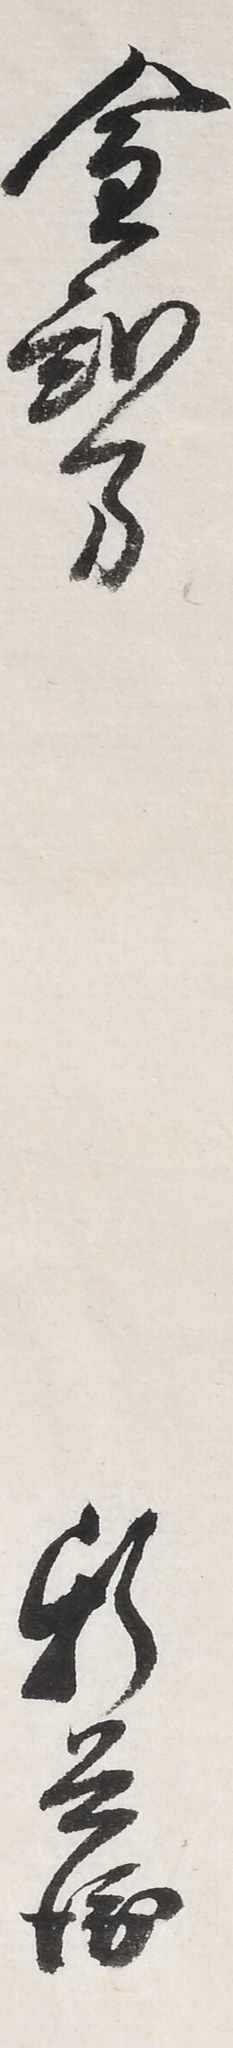金弐分新兵衛
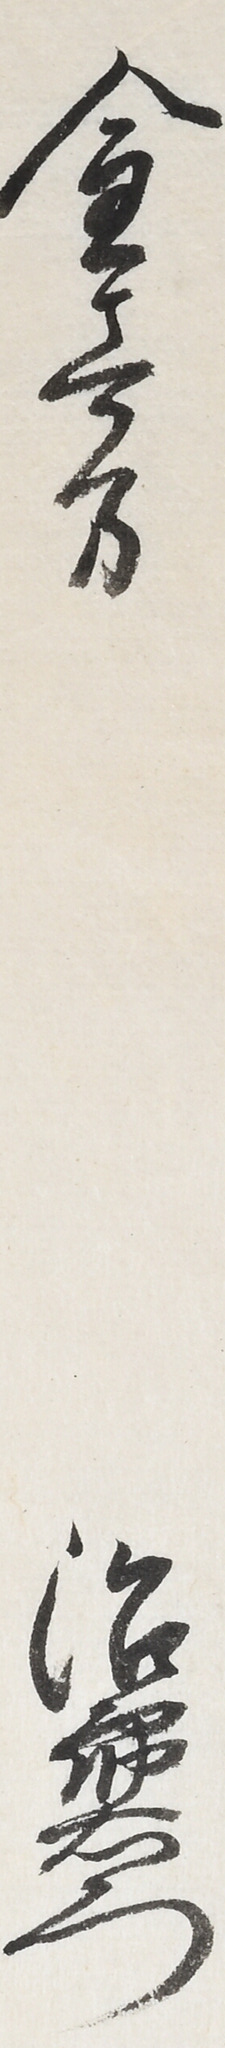金壱分治郎右衛門
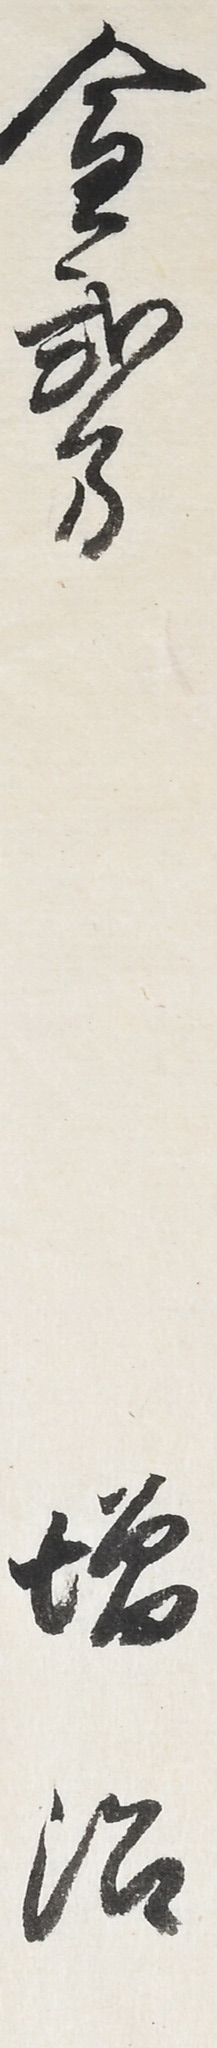金弐分増治
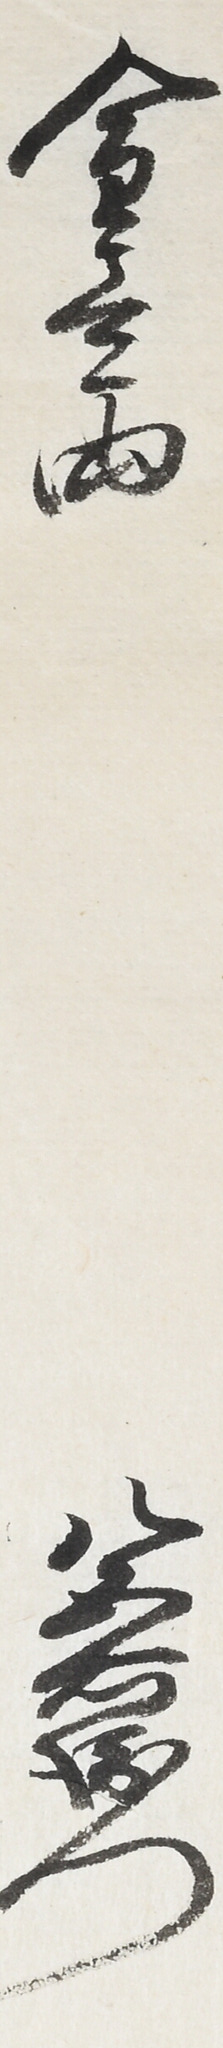金壱両八五右衛門
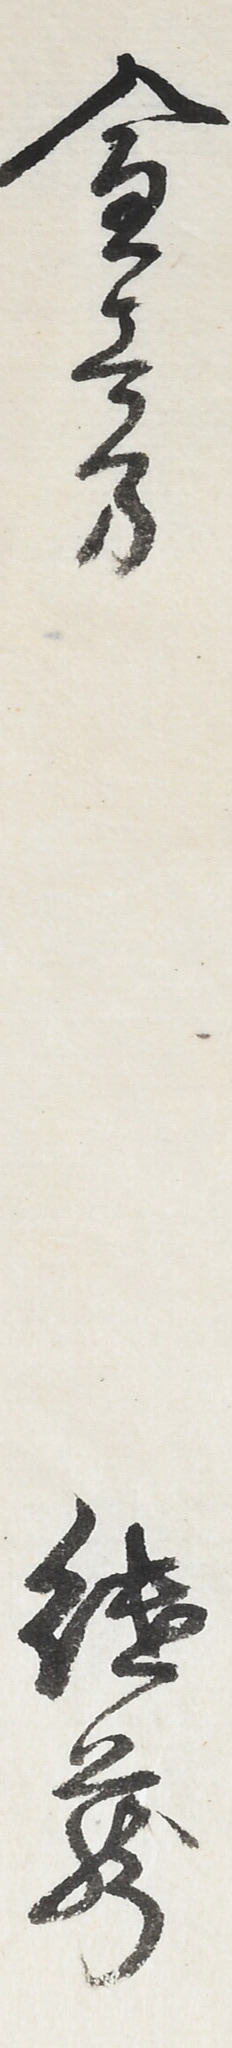金壱分継蔵

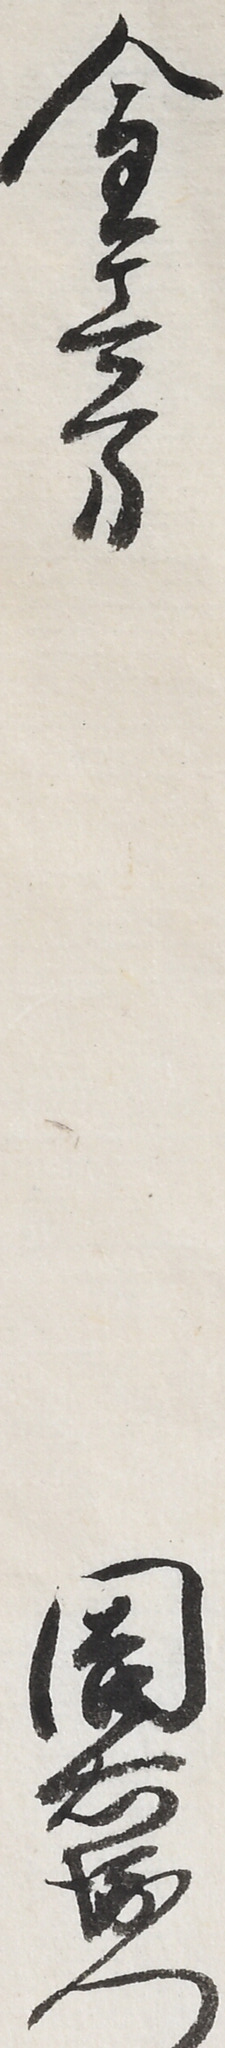金壱分園右衛門
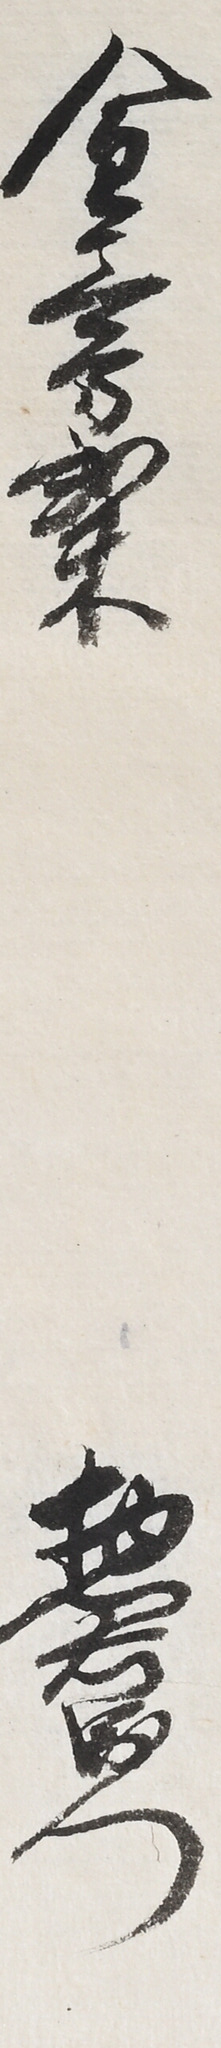金壱分弐朱惣右衛門
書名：御拝地百五拾年御祝儀献上御目録名前
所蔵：伊那市立高遠町図書館・合同会社AMANE
